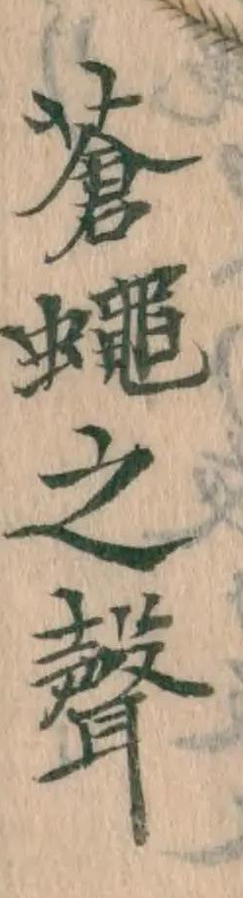蒼蠅之聲
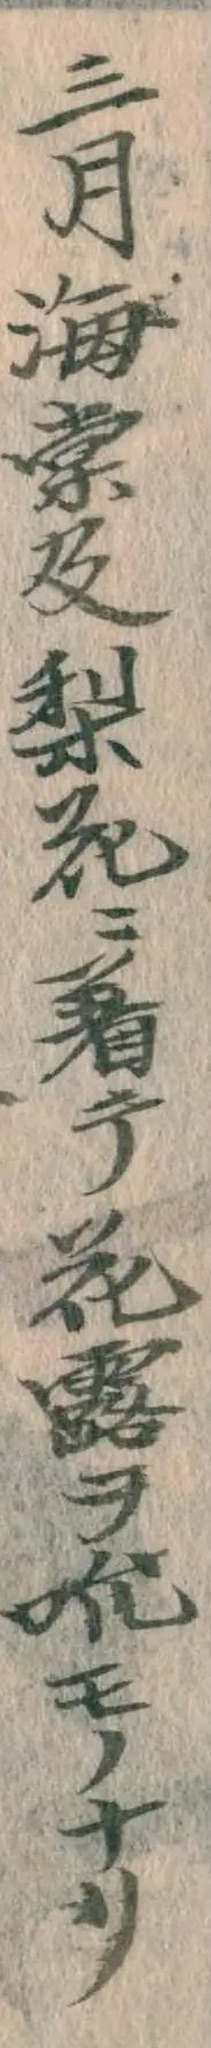三月海棠及梨花ニ着テ花露ヲ吮モノナリ
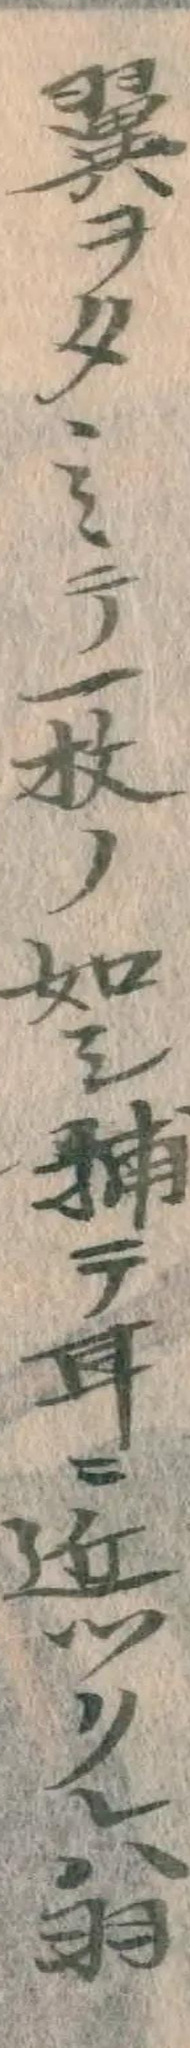翼ヲタヽミテ一枚ノ如シ捕テ耳ニ近ツクレハ羽
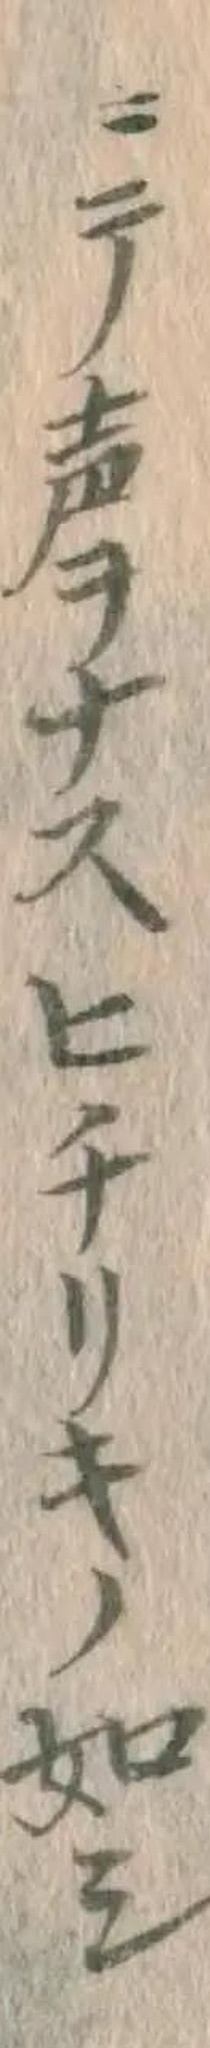ニテ声ヲナスヒチリキノ如シ

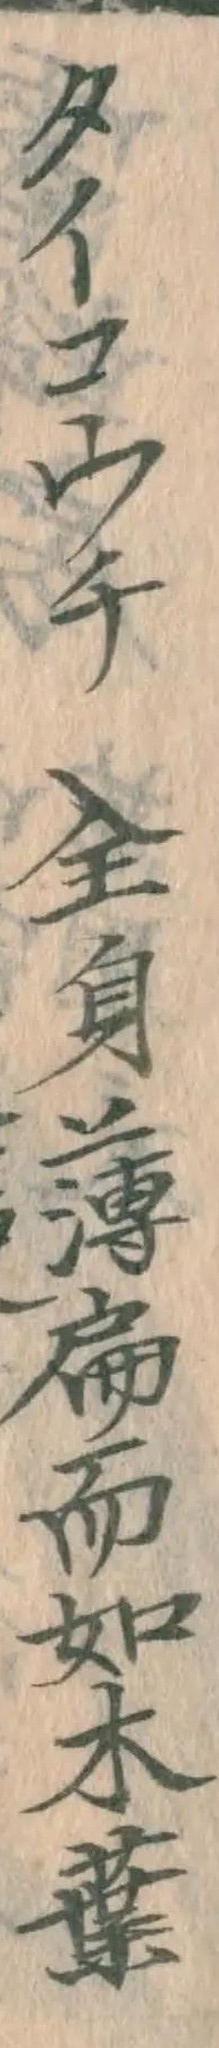タイコウチ全身薄扁而如木葉
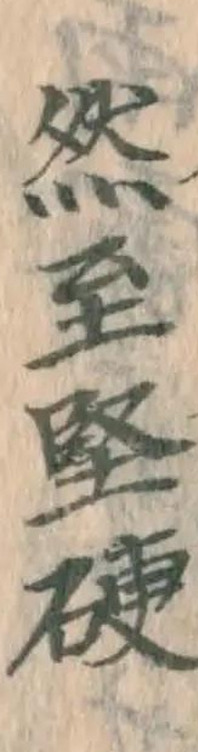然至堅硬
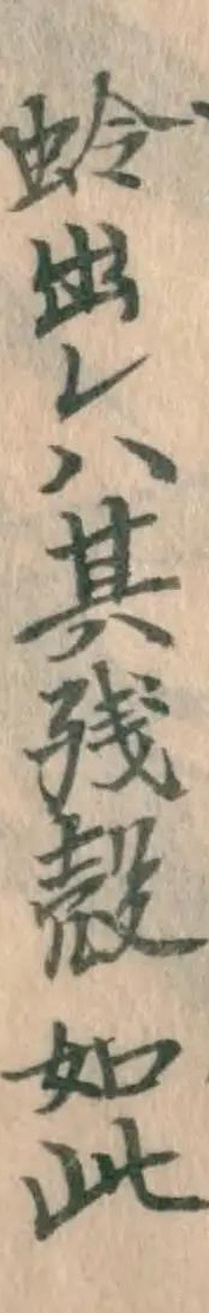蛉出レハ其残殻如此
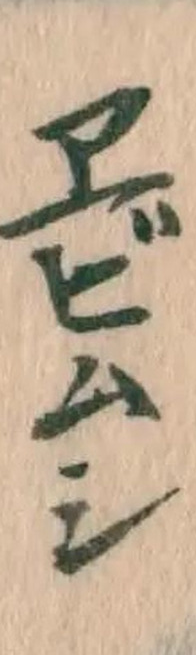ヱビムシ
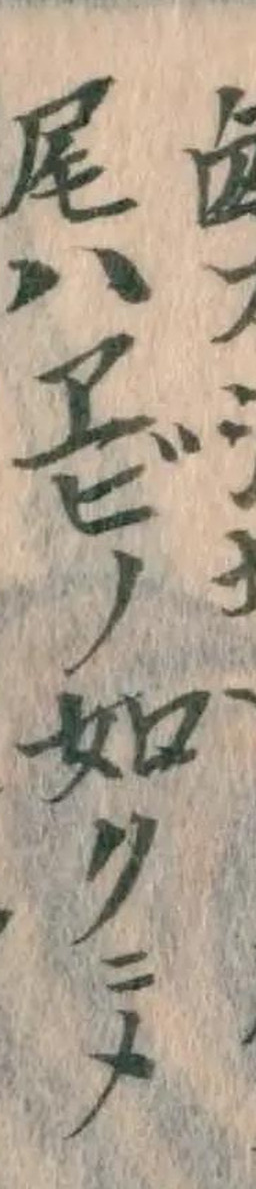尾ハヱビノ如クニシテ
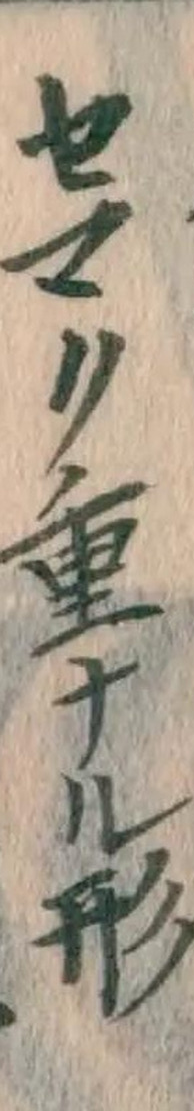セマク重ナル形
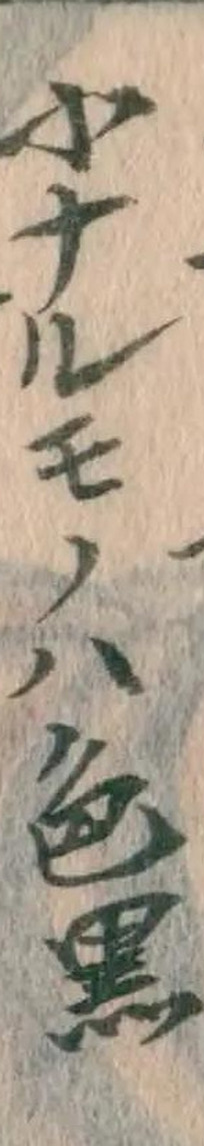小ナルモノハ色黒
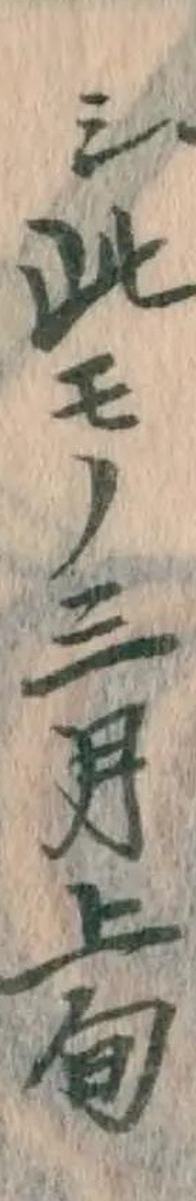シ此モノ三月上旬
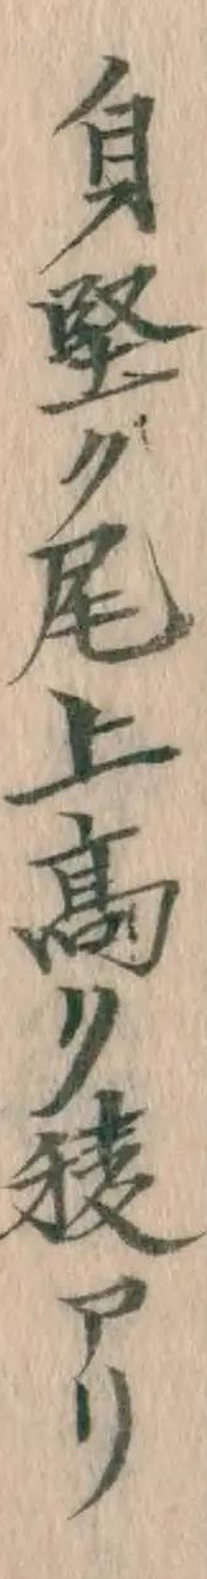身堅ク尾上高ク稜アリ
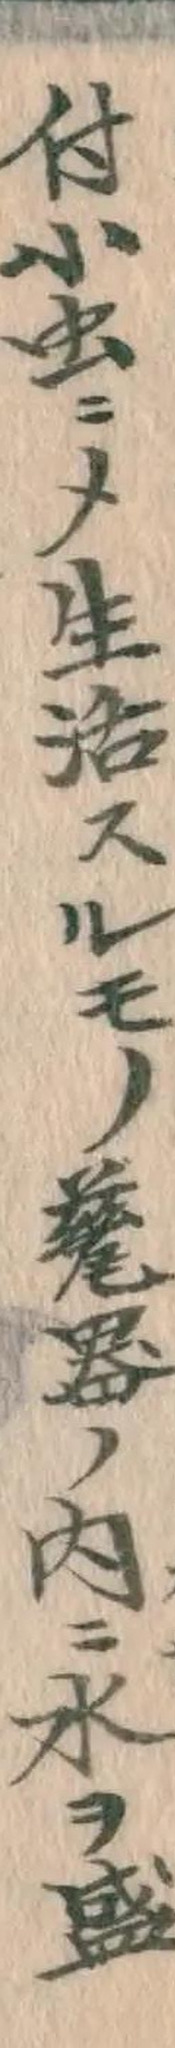付小虫ニシテ生活スルモノ甕器ノ内ニ水ヲ盛
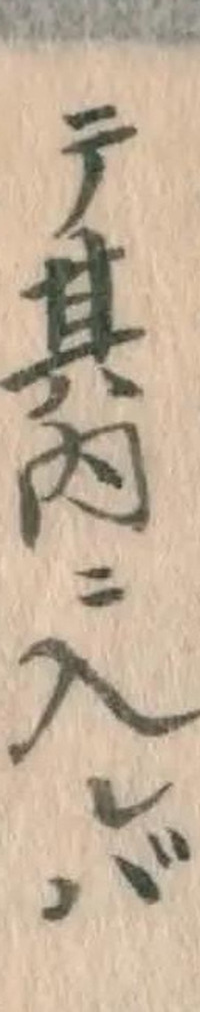テ其内ニ入レバ
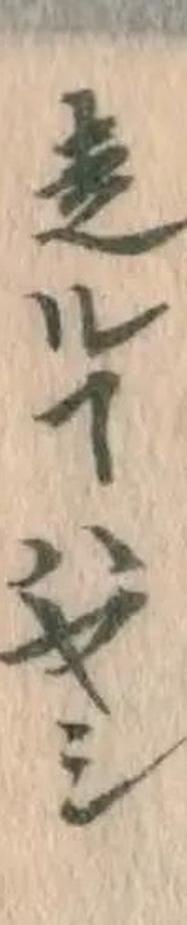走ルコトハヤシ
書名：千蟲譜 3巻. [3]
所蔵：国立国会図書館 National Diet Library, JAPAN
